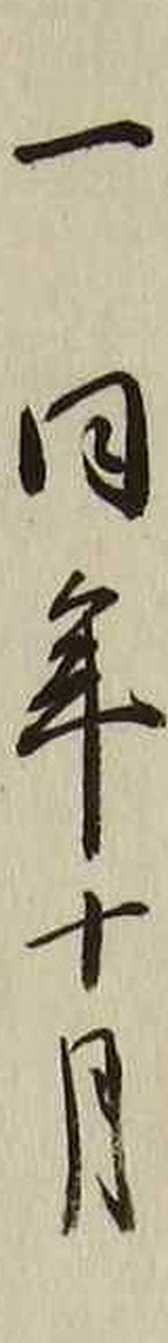一同年十月
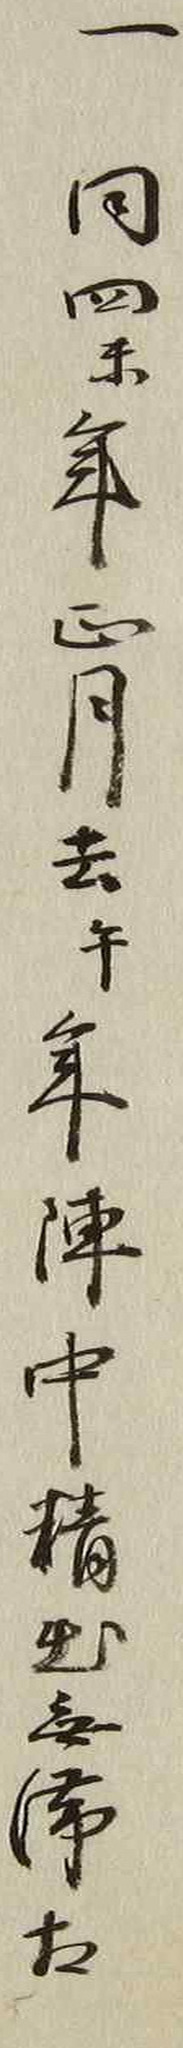一同四未年正月去午年陣中精出し滞り無く相
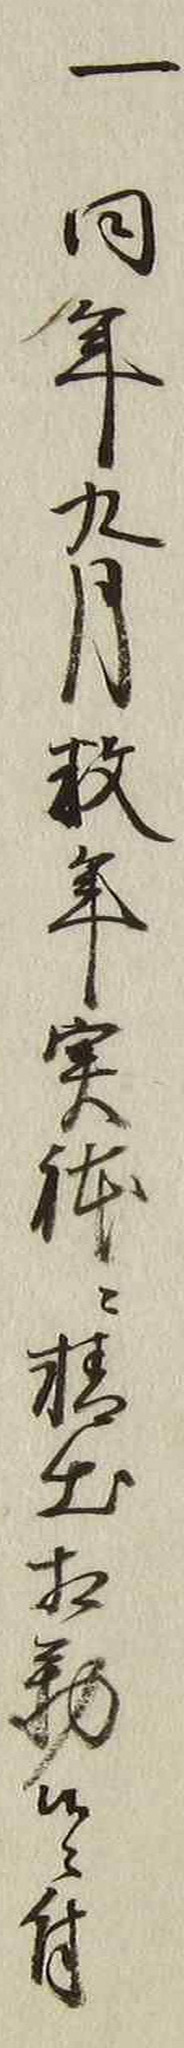一同年九月数年実体ニ精出し相勤候ニ付き
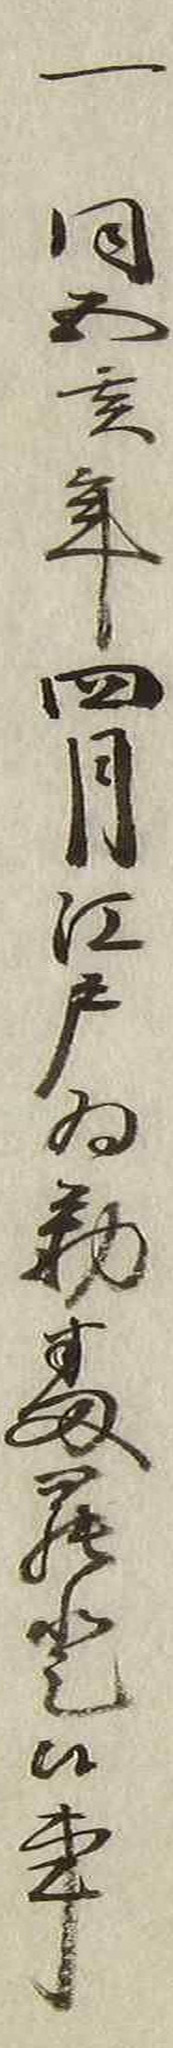一同五亥年四月江戸勤番之為罷り登り候事
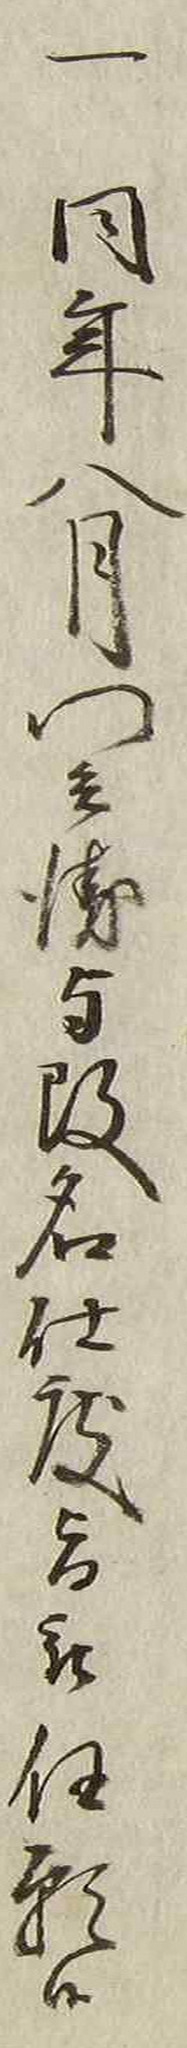一同年八月門兵衛と改名仕り度旨任せ願われ候
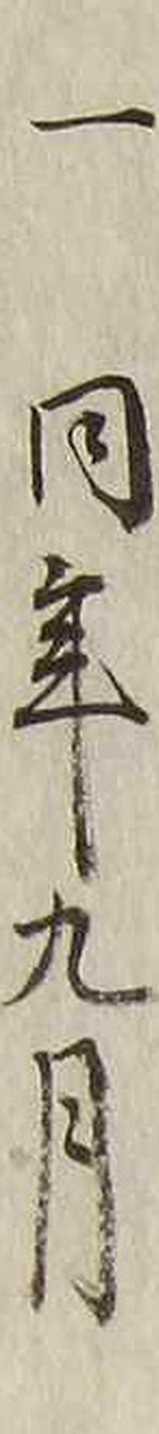一同年九月

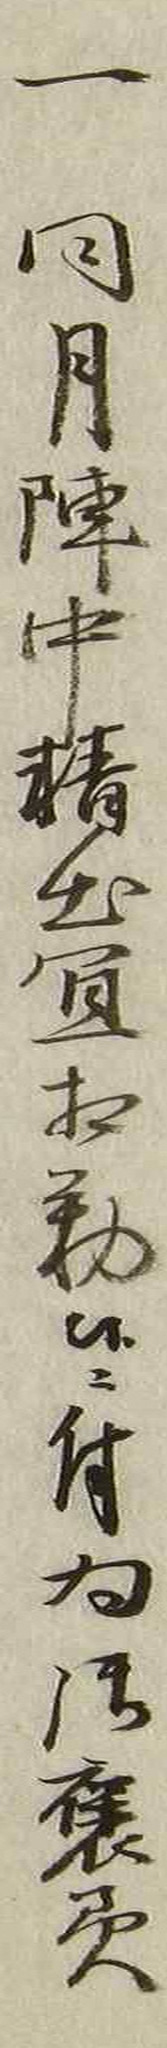一同年十月陣中精出し相勤め候ニ付き御褒美
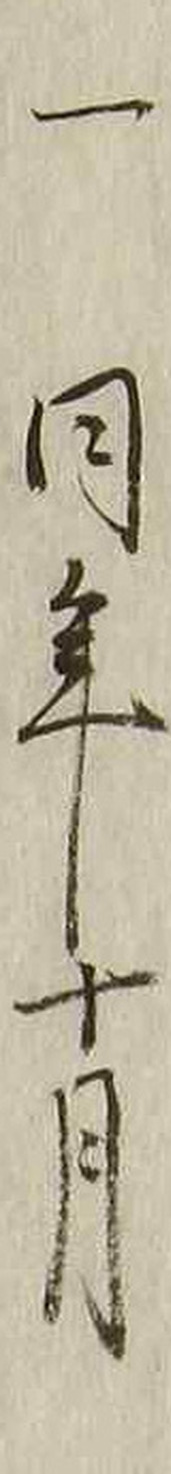一同年十月
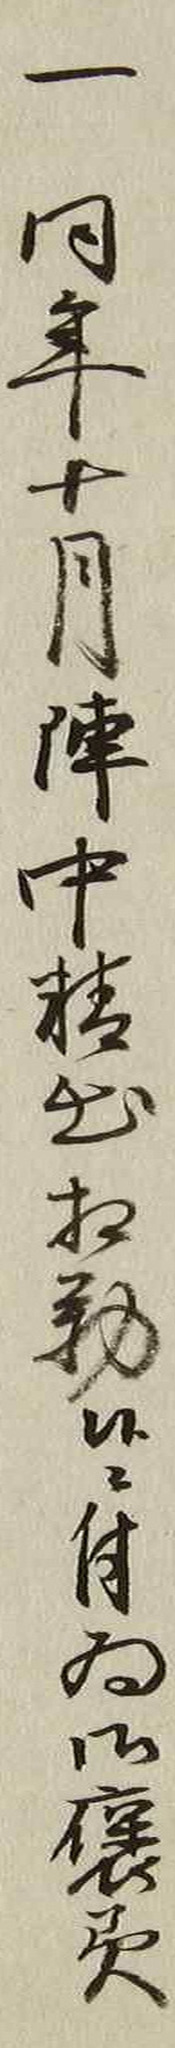一同年十月陣中精出し相勤め候ニ付き御褒美
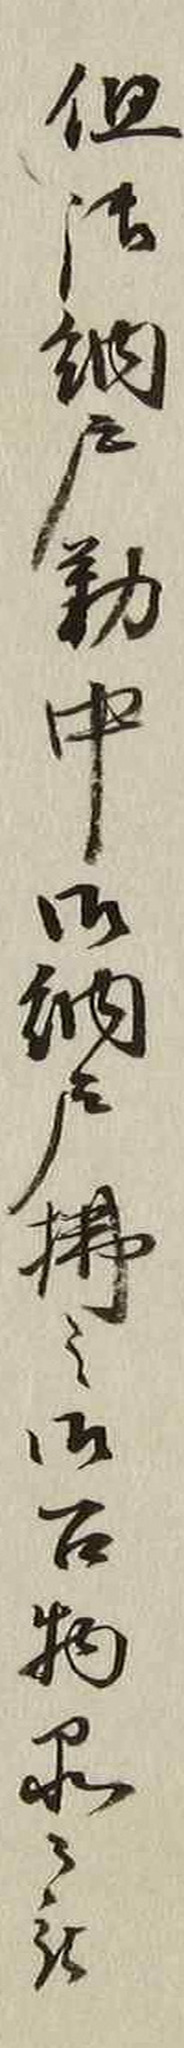但し御納戸勤め中御納戸拂い之御召物品々
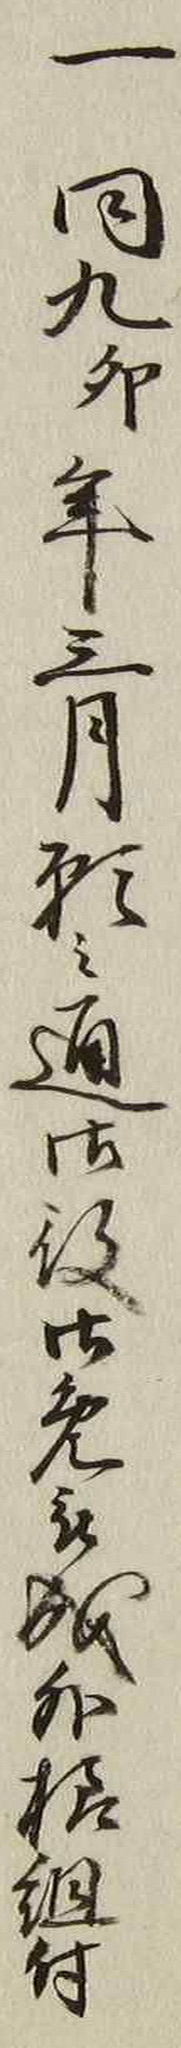一同九卯年三月願之通り御役御免成られ候様組付き
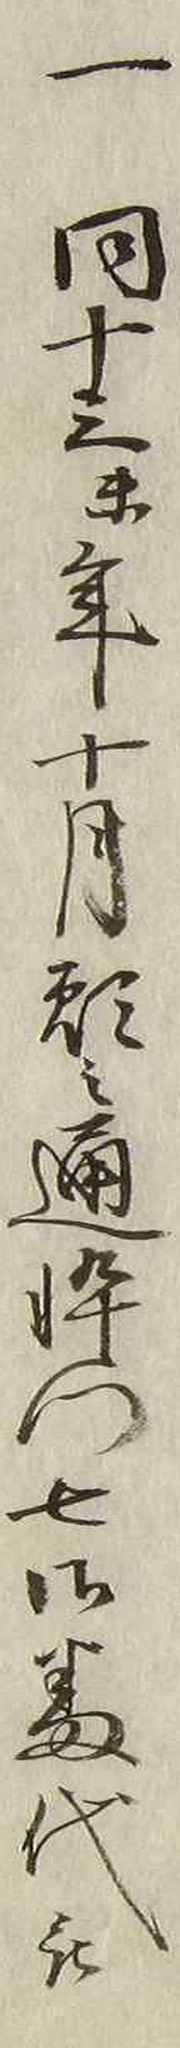一同十三未年十月願之通り倅門七御番代
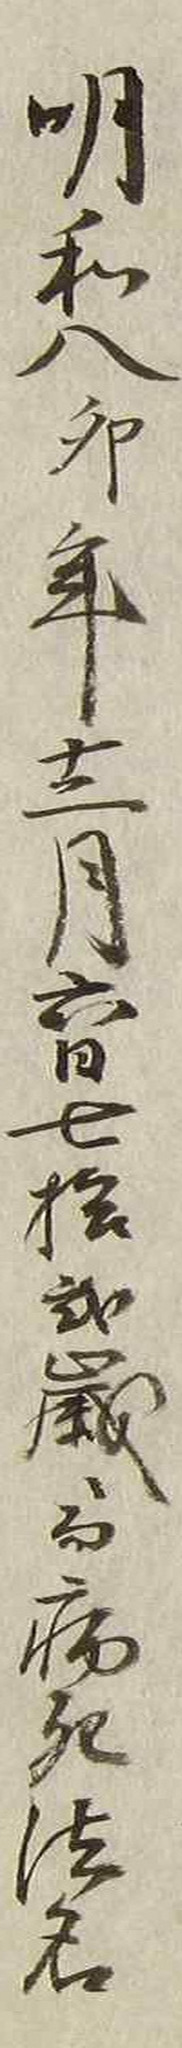一明和八卯年十二月六日七拾弐歳ニて病死法名
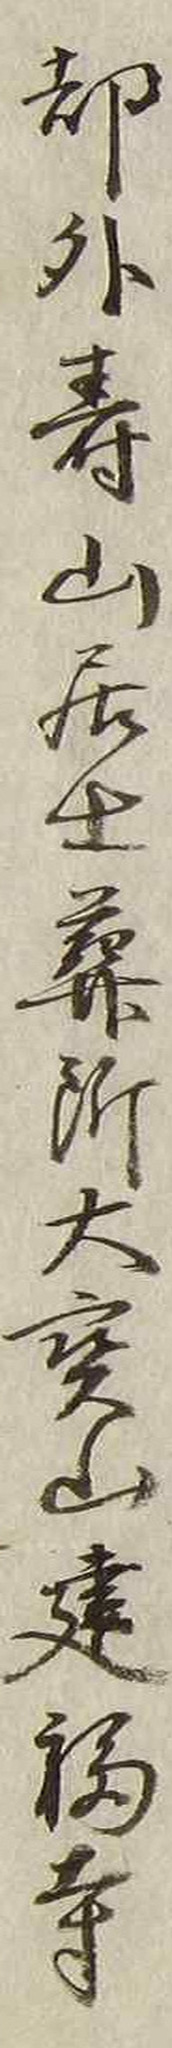却外寿山居士葬所大宝山建福寺

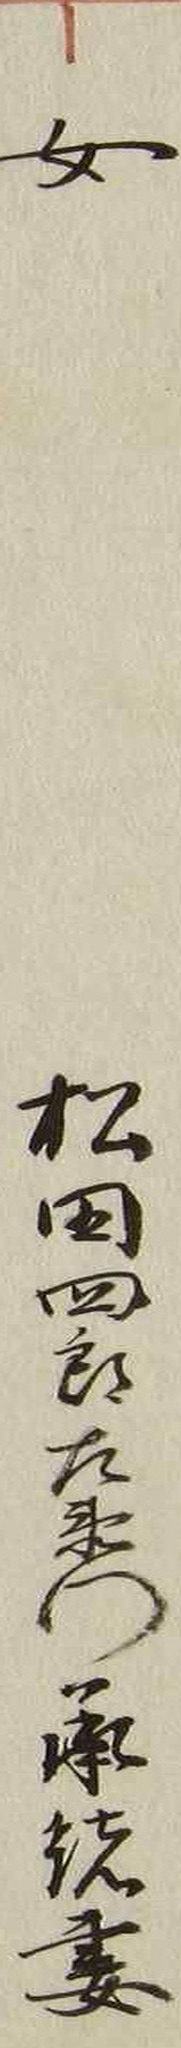女松田四郎左衛門承統妻
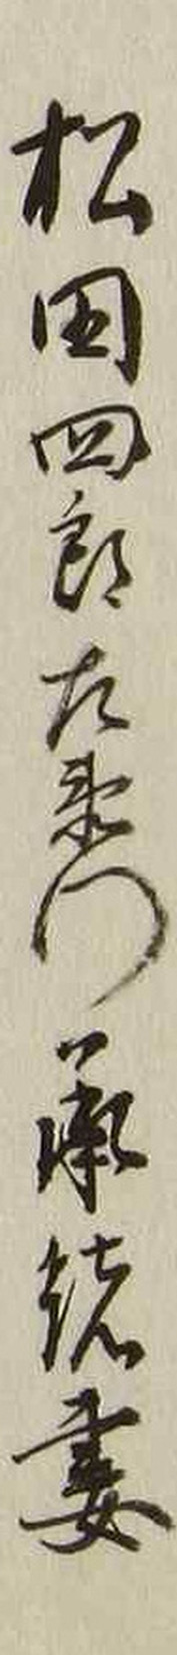女松田四郎左衛門承統妻
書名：諸士系譜　巻之19　い之部19
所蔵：会津若松市立会津図書館
